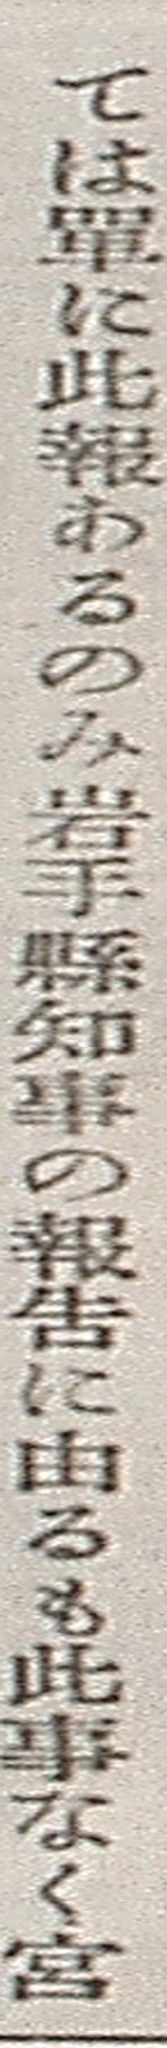ては単に此報あるのみ岩手県知事の報告に由るも此事なく宮
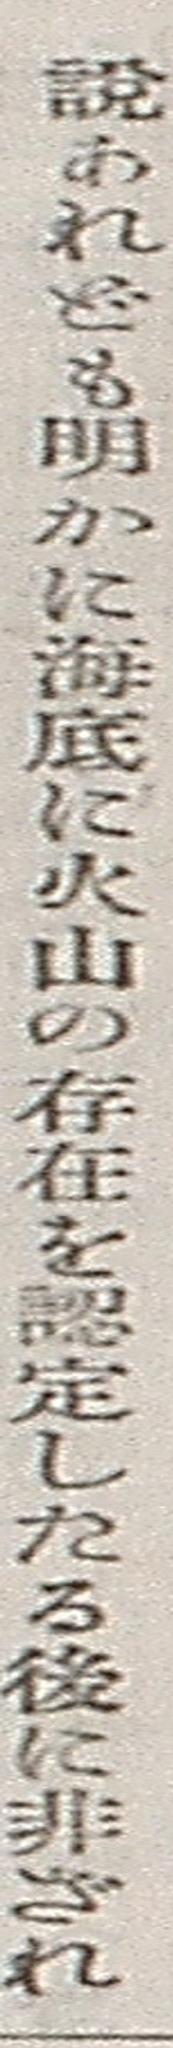説あれども明かに海底に火山の存在を認定したる後に非ざれ
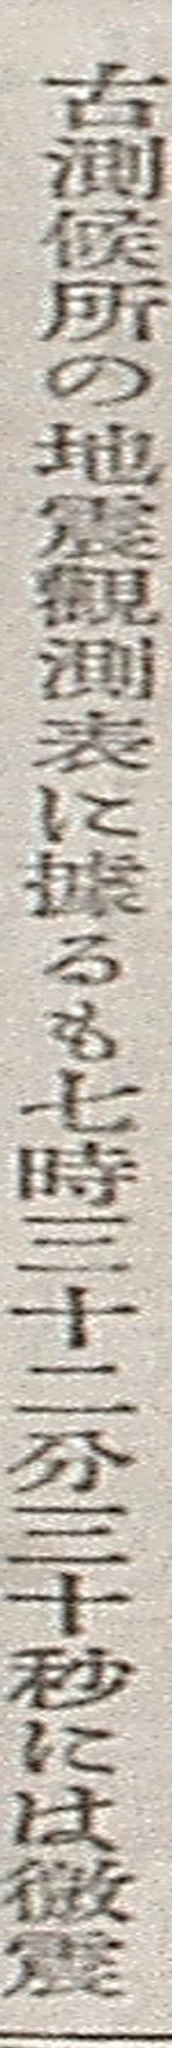古測候所の地震観測表に拠るも七時三十二分三十秒には微震
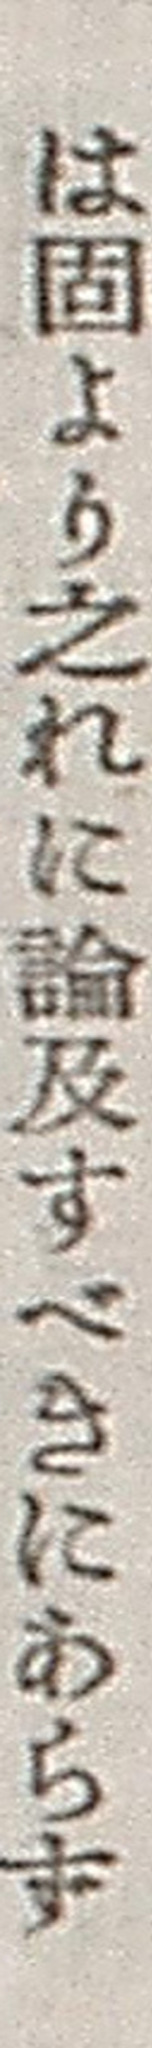は固より之れに論及すべきにあらず
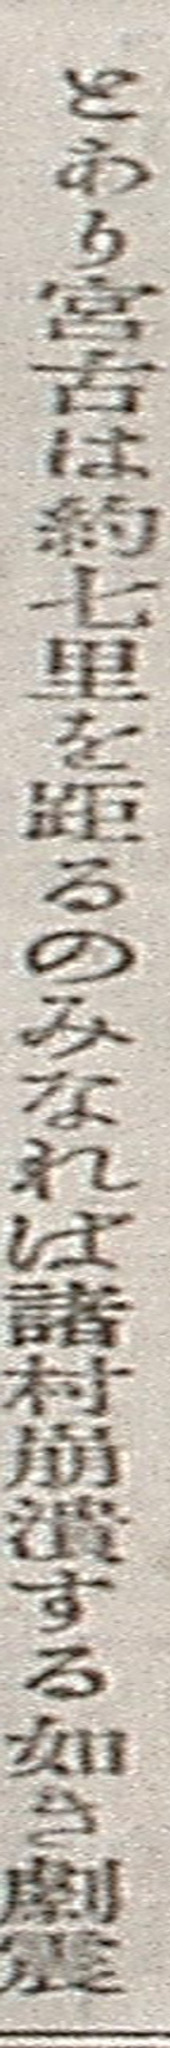とあり宮古は約七里を距るのみなれば諸村崩潰する如き劇震
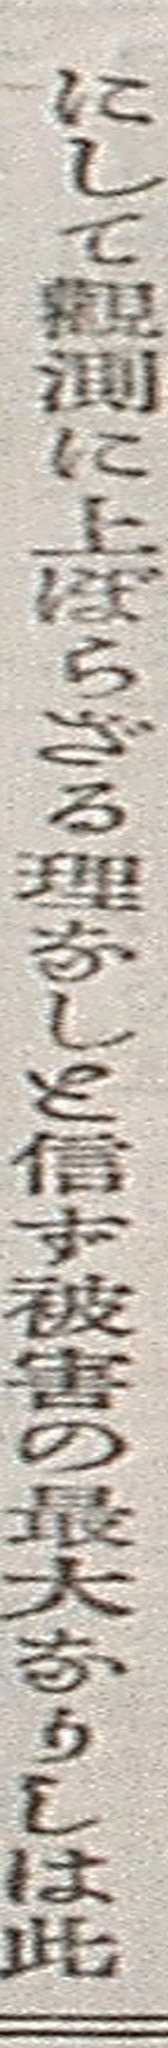にして観測に上ぼらざる理なしと信ず被害の最大なりしは此
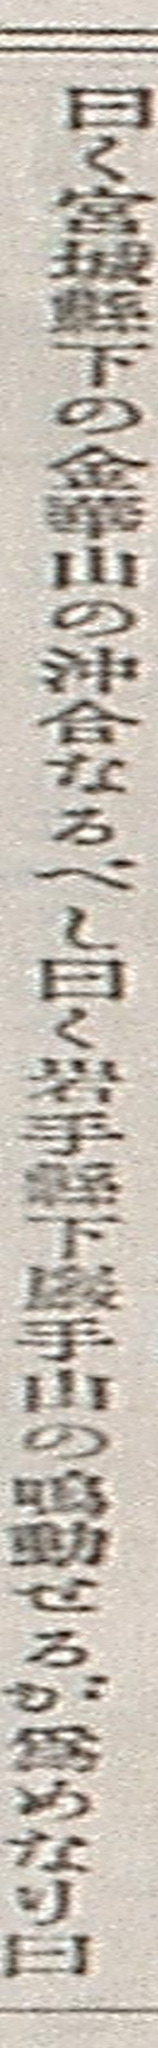曰く宮城県下の金華山の沖合なるべし曰く岩手県下巌手山の鳴動せるが為めなり曰
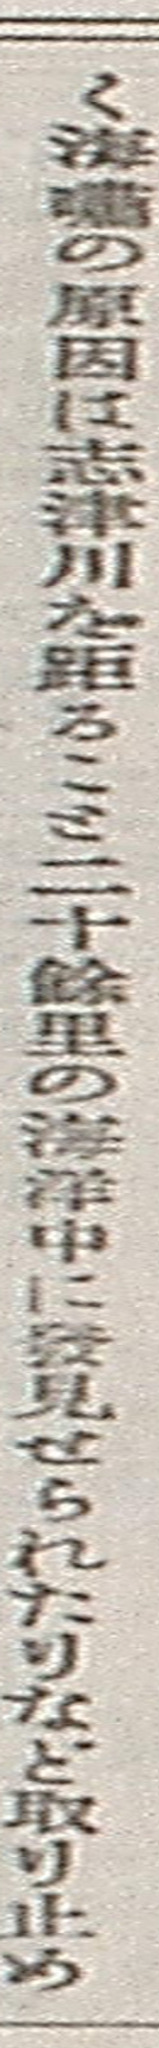く海嘯の原因は志津川を距ること二十余里の海洋中に発見せられたりなど取り止め
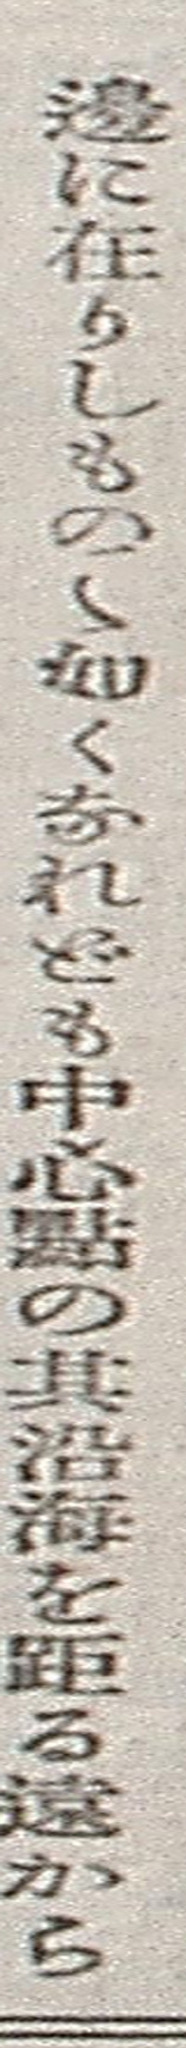辺に在りしものゝ如くなれども中心点の其沿海を距る遠から
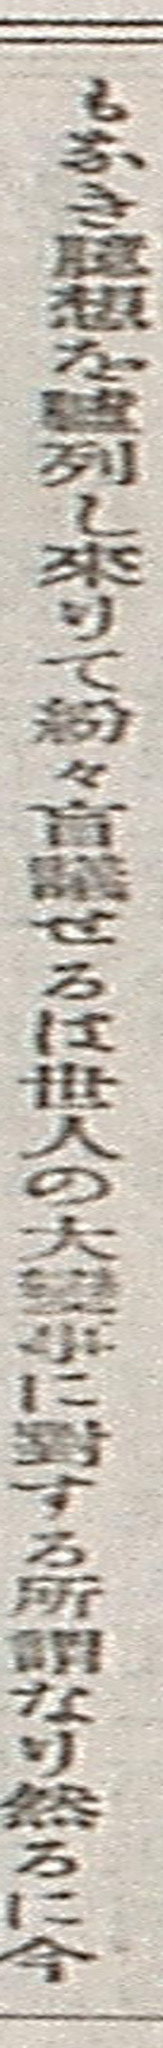もなき臆想を臚列し来りて粉々盲議せるは世人の大変事に対する所謂なり然るに今
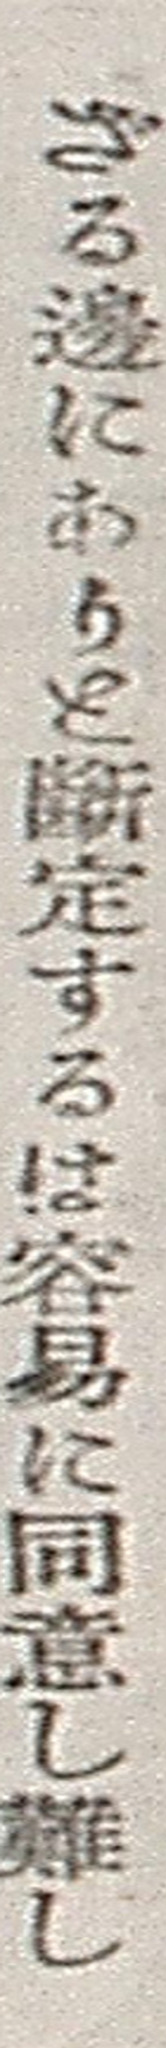ざる辺にありと断定するは容易に同意し難し
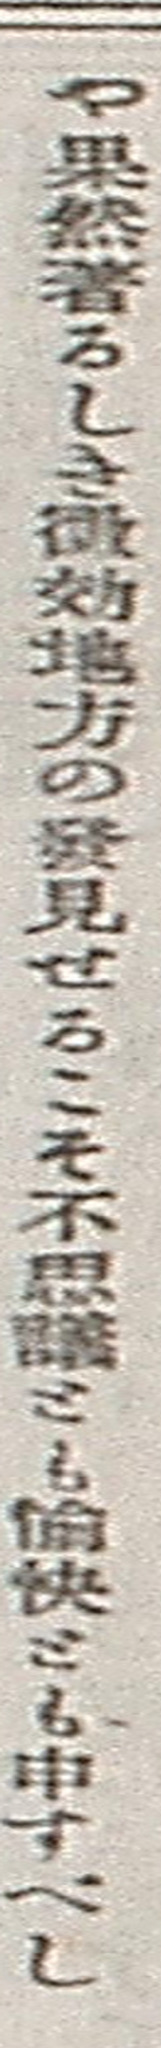や果然著るしき徴効地方の発見せるこそ不思議とも愉快とも申すべし
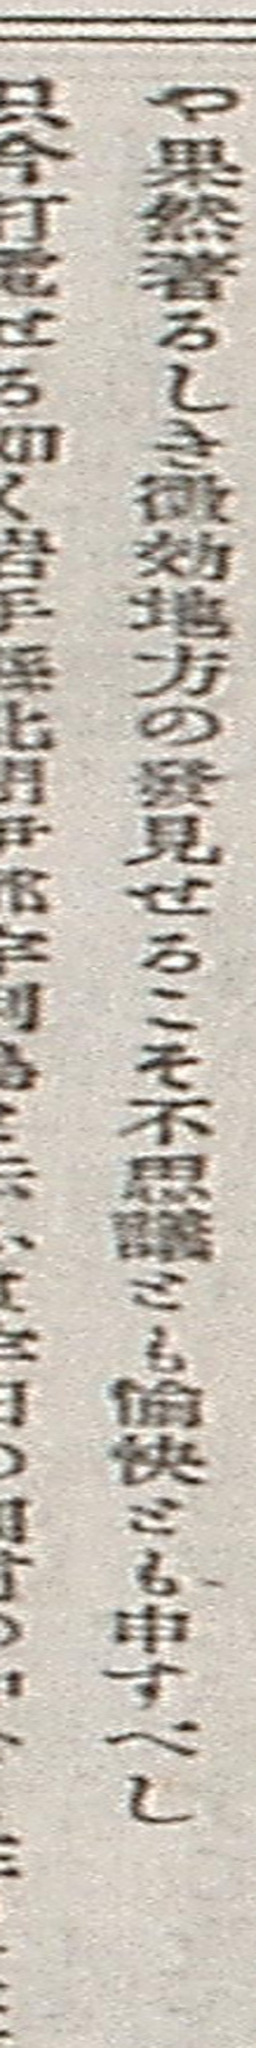只今打電せる如く岩手県北閉伊郡宇利島と云ふは宇田の畑村の沖合に在りて其陸地
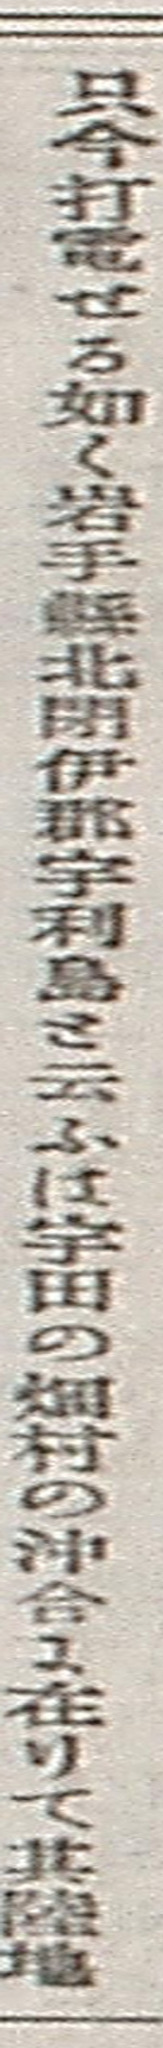只今打電せる如く岩手県北閉伊郡宇利島と云ふは宇田の畑村の沖合に在りて其陸地
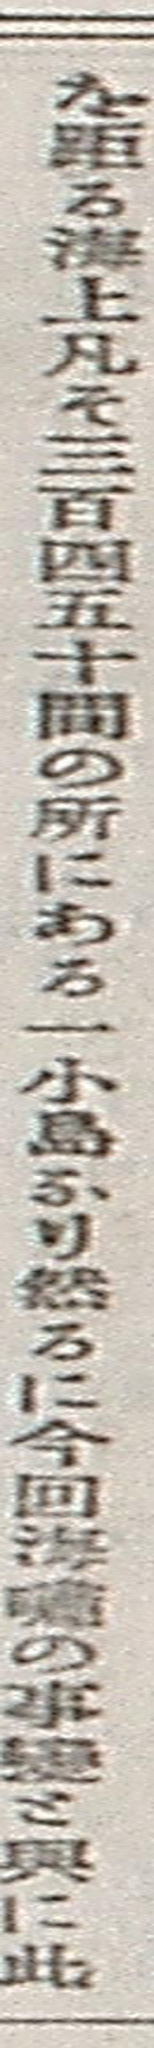を距る海上凡そ三百四五十間の所にある一小島なり然るに今回海嘯の事変と与に此
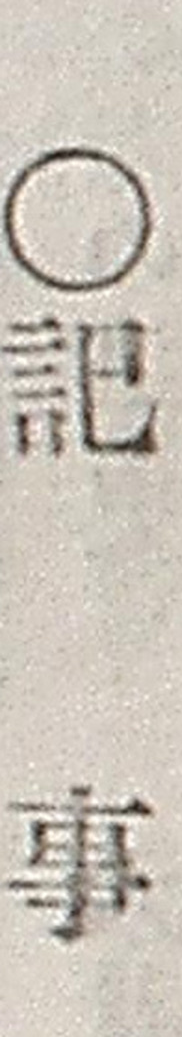○記事
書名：風俗畫報臨時増刊第百十九號　大海嘯被害録（中）
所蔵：東京大学地震研究所図書室 Earthquake Research Institute Library, The University of Tokyo, JAPAN
